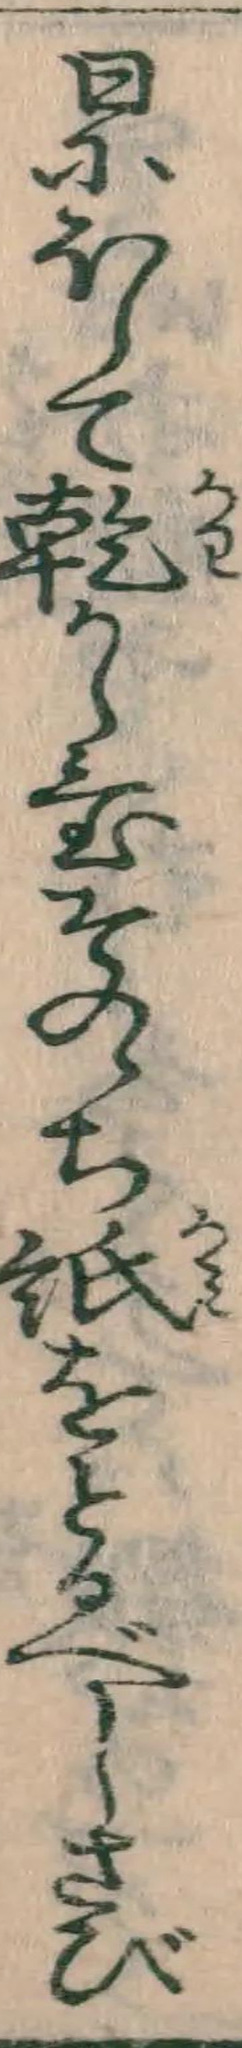日にほして乾かし置そのゝち紙をとるべしさび
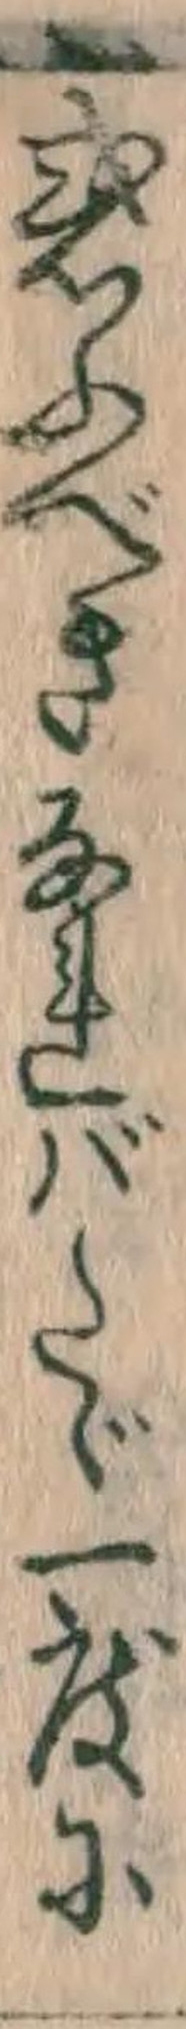惑ふべきなればたゞ一度に
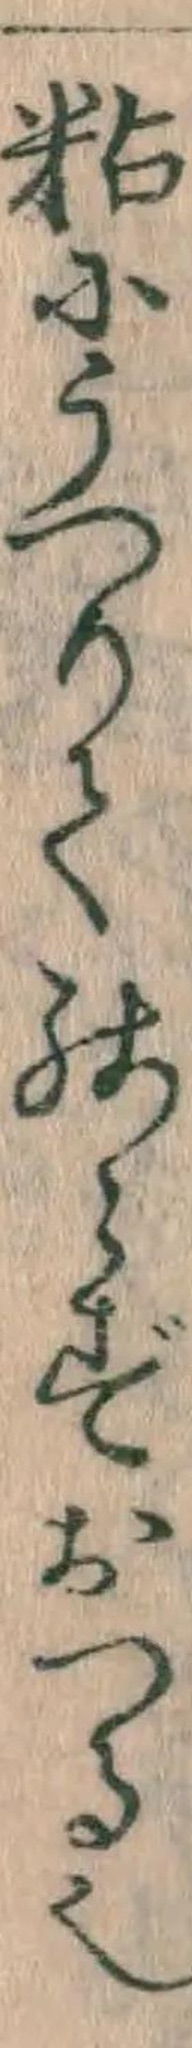粘にうつりて残らずおつる也
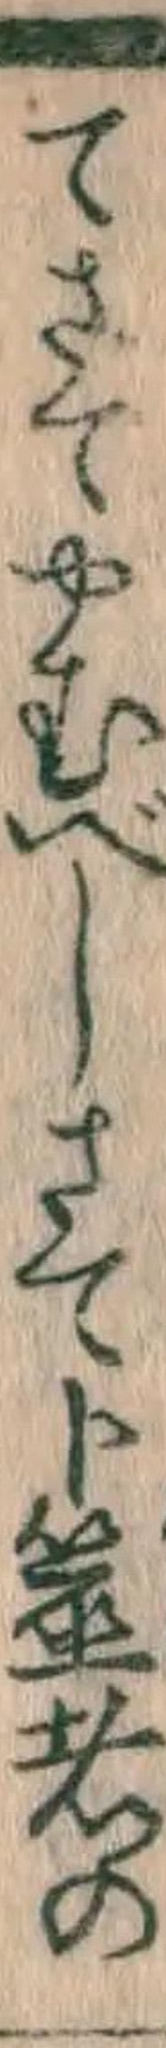てさてやむべしさて占筮者の
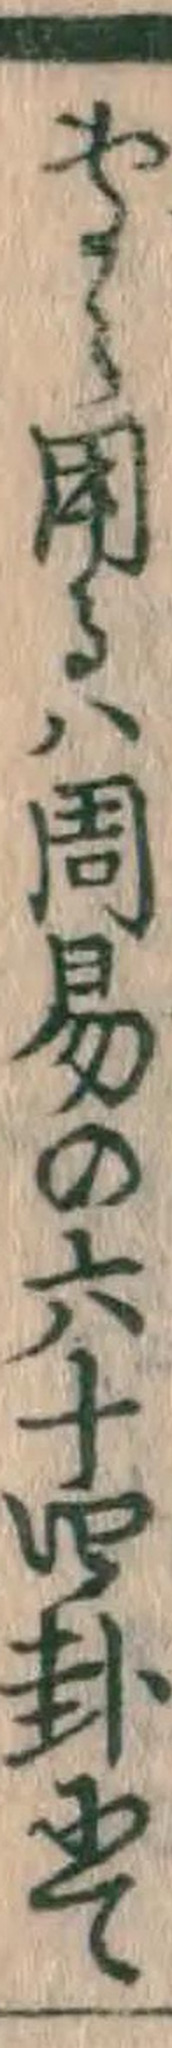専ら用るは周易の六十四卦にて
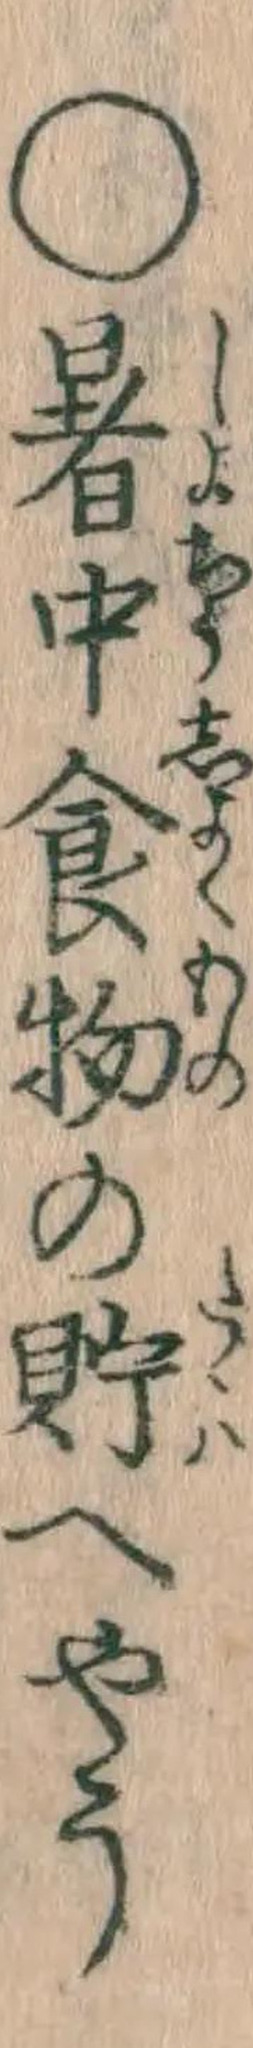○暑中食物の貯へやう
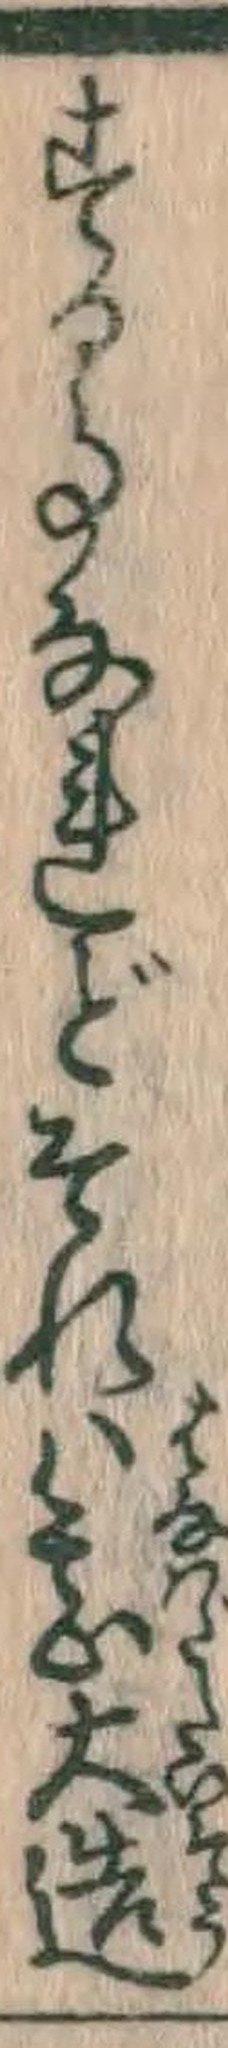する事なれどそれは甚大造
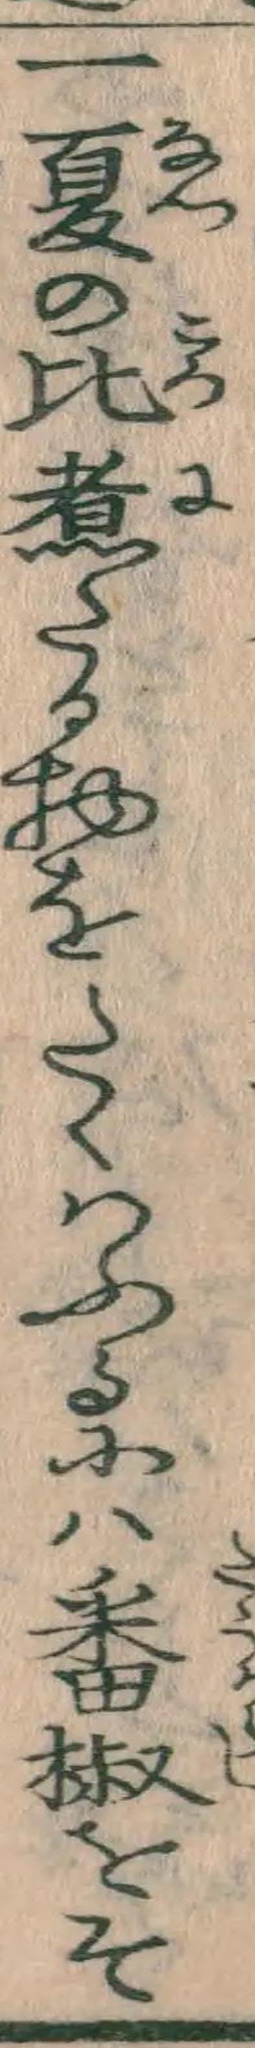一夏の比煮たる物をたくはふるには番椒をそ
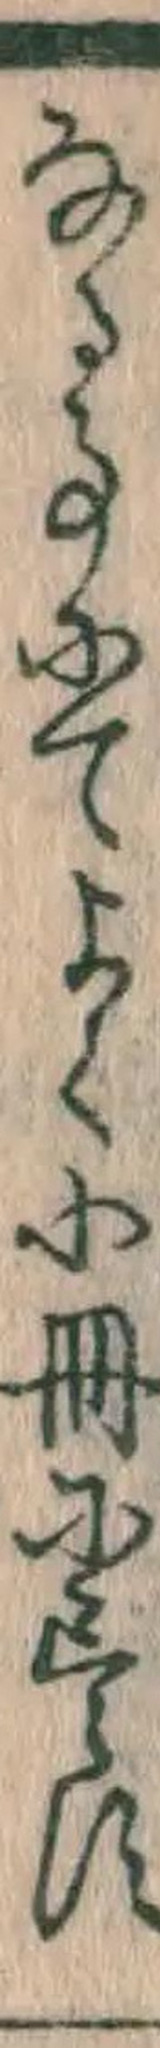なる事にてよく小冊に尽す
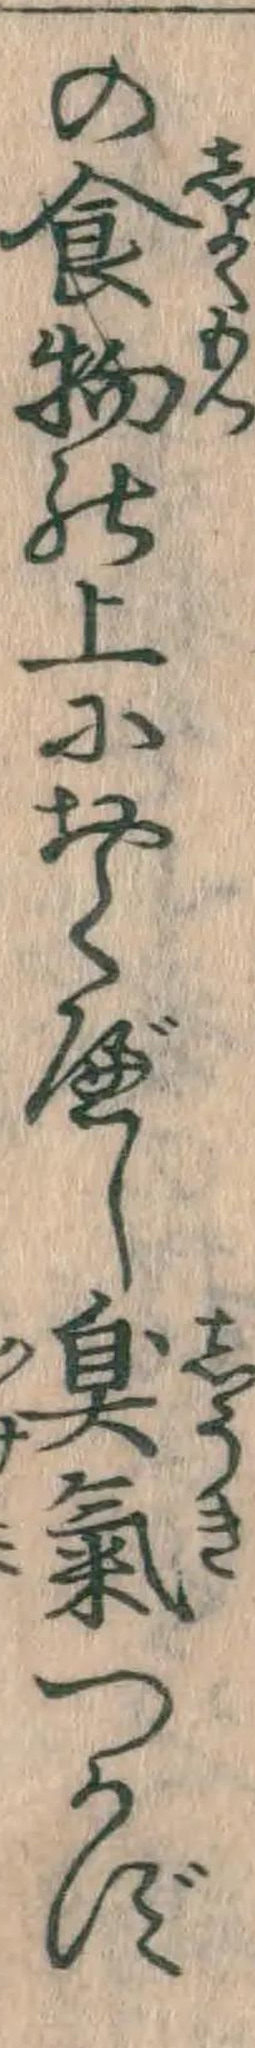の食物の上におくべし臭気つかず
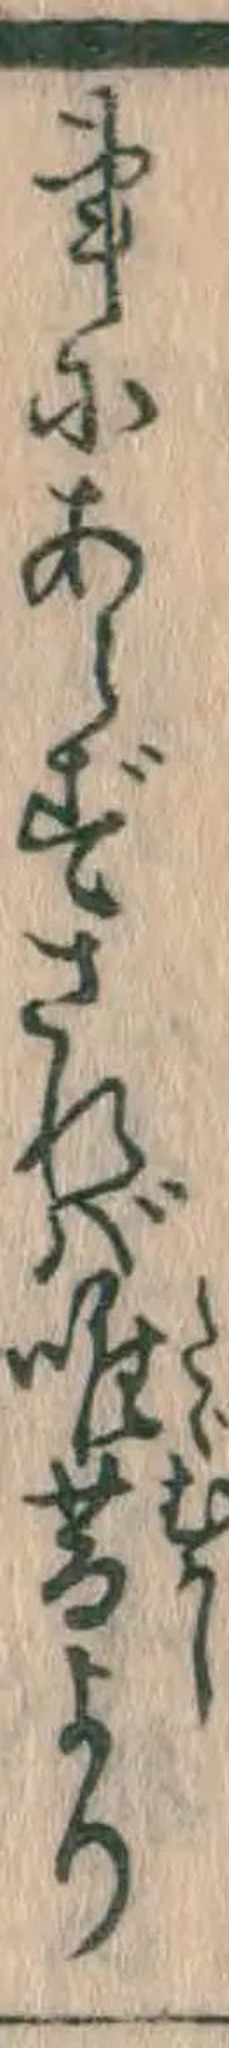事にあらずされば唯昔より
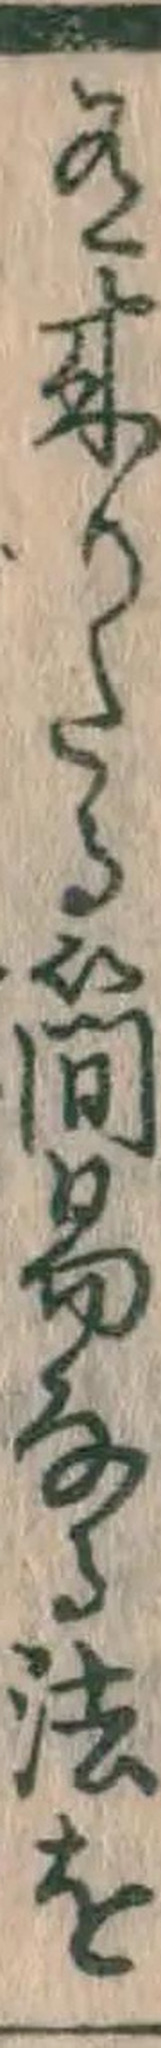有来りたる簡易なる法を
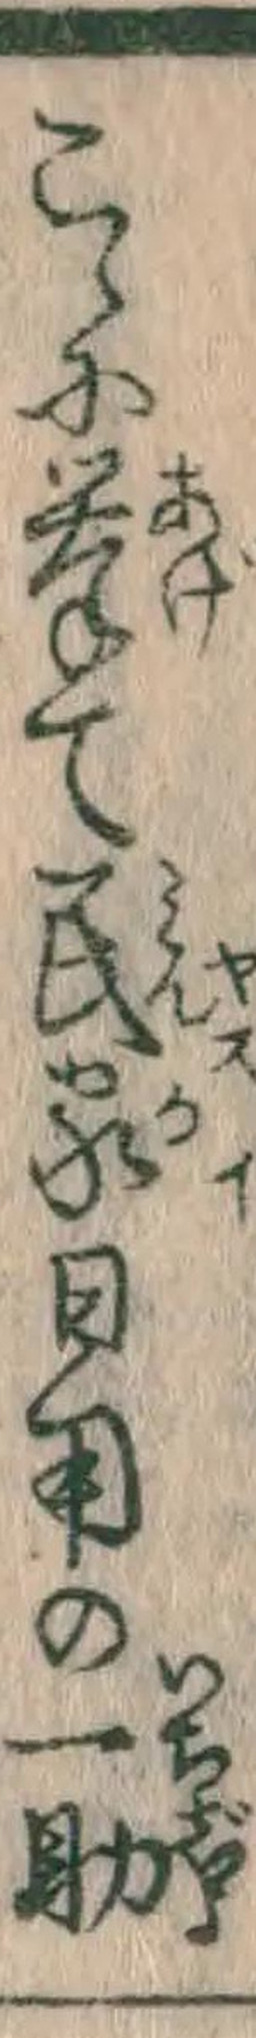こゝに挙て民家日用の一助
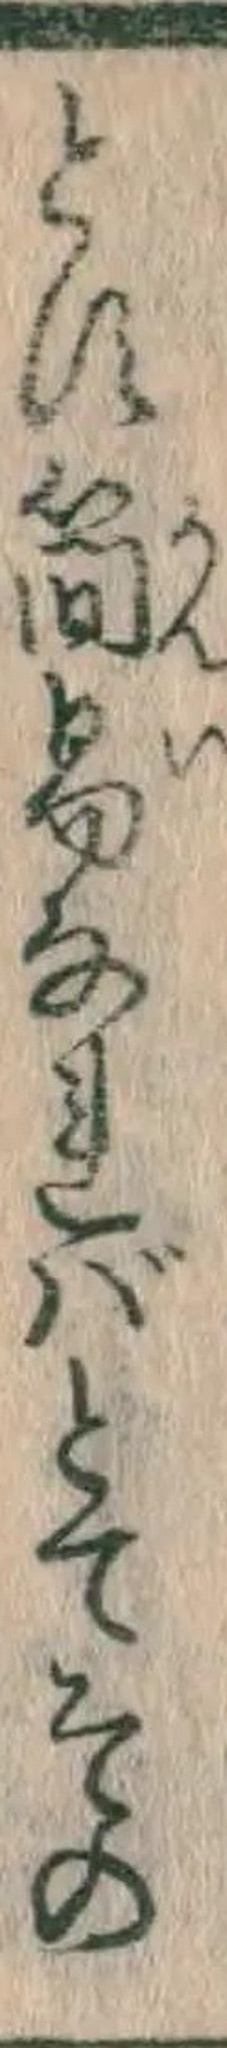とす簡易なればとてその
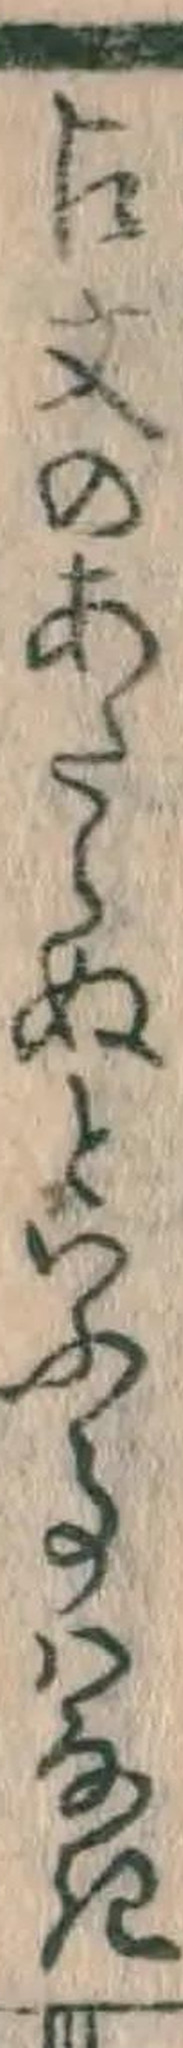占文のあたらぬといふ事はなき
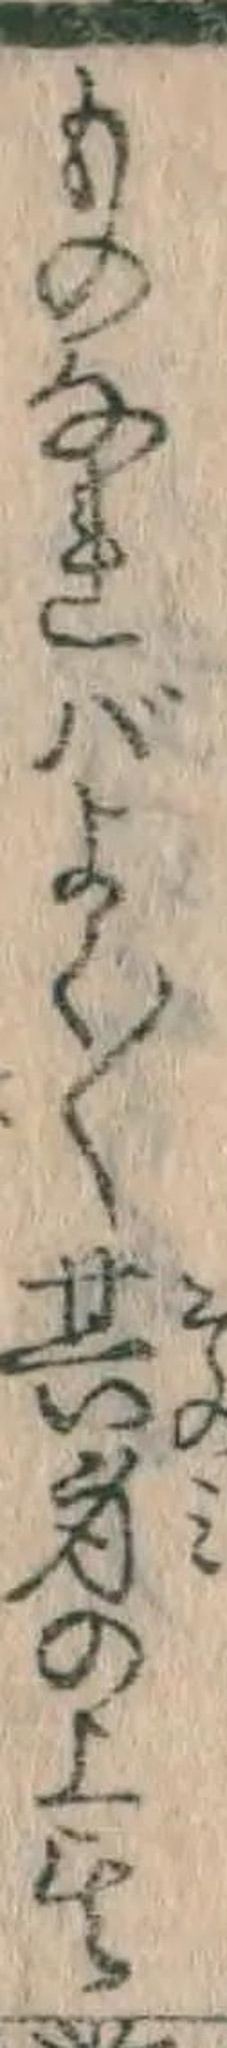ものなればよく〳〵其身の上其
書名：広益秘事大全 3巻. [1]
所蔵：国立国会図書館 National Diet Library, JAPAN
